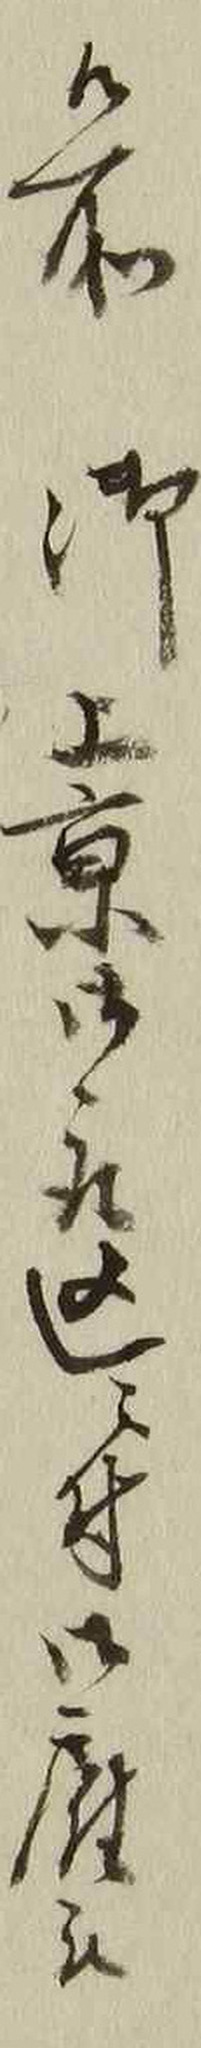候所御上京御取込ニ付御雇被
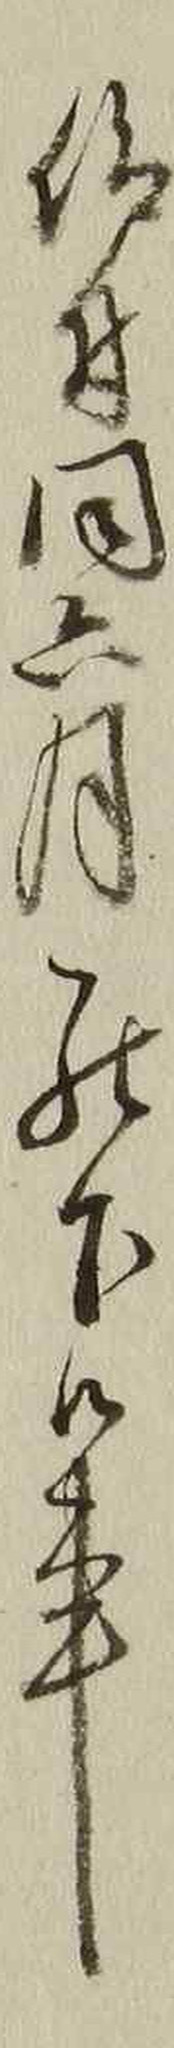仰付同六月罷下候事
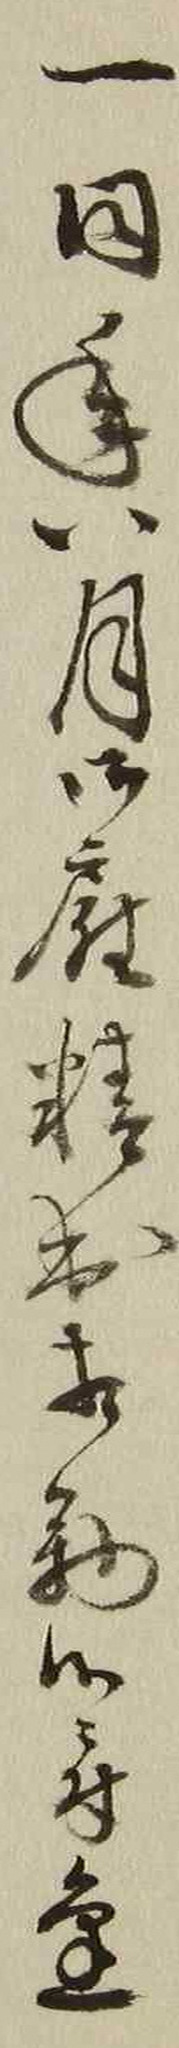一同年八月御雇精出相勤候ニ付金
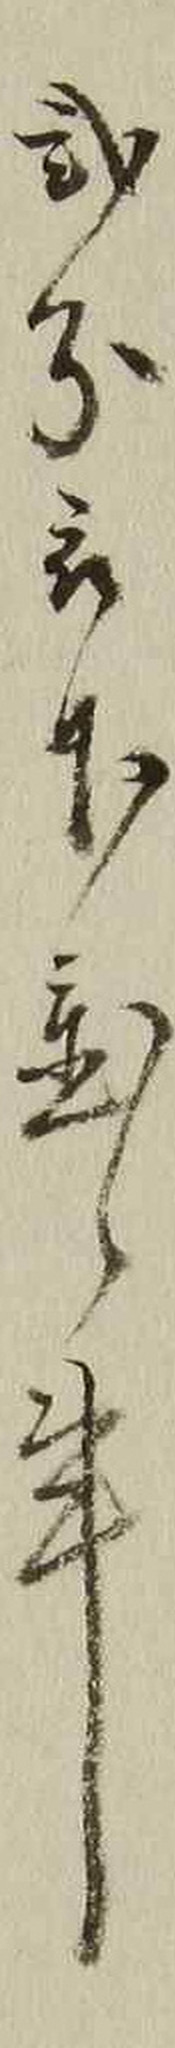弐分被下置候事
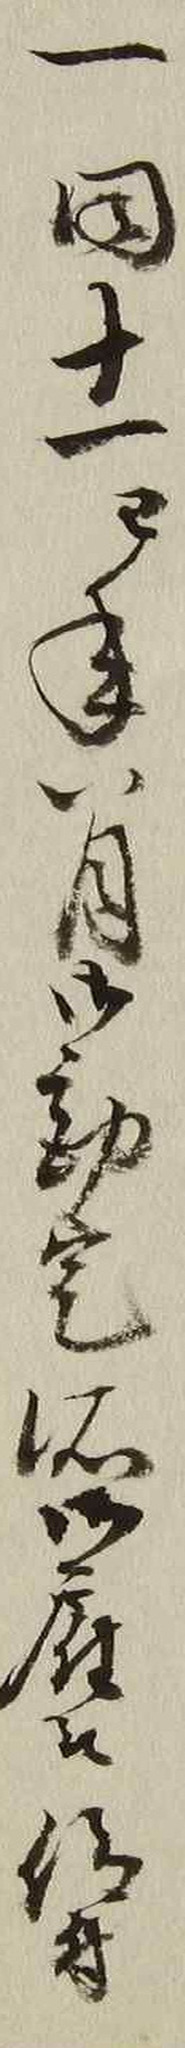一同十一巳年八月御勘定所御雇被仰付
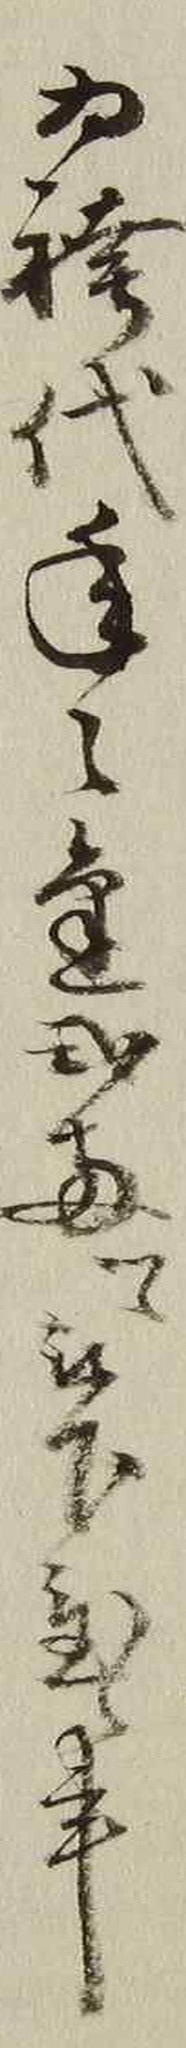為袴代年々金弐両ツヽ被下置候事
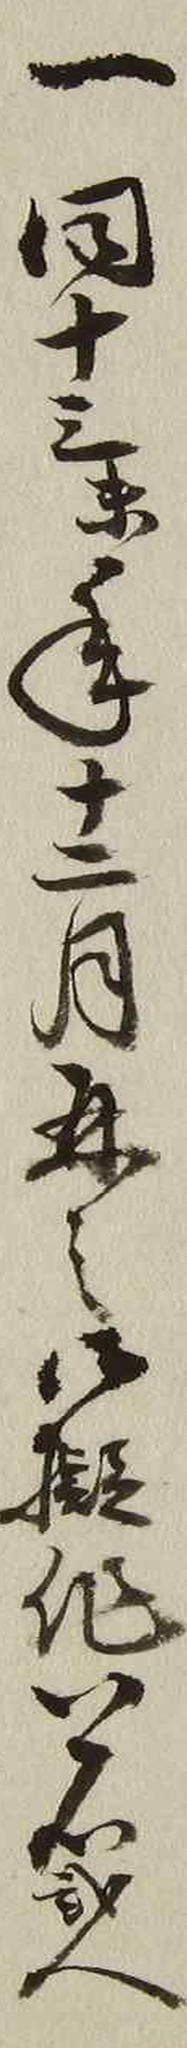一同十三未年十二月並之御擬作八石弐人
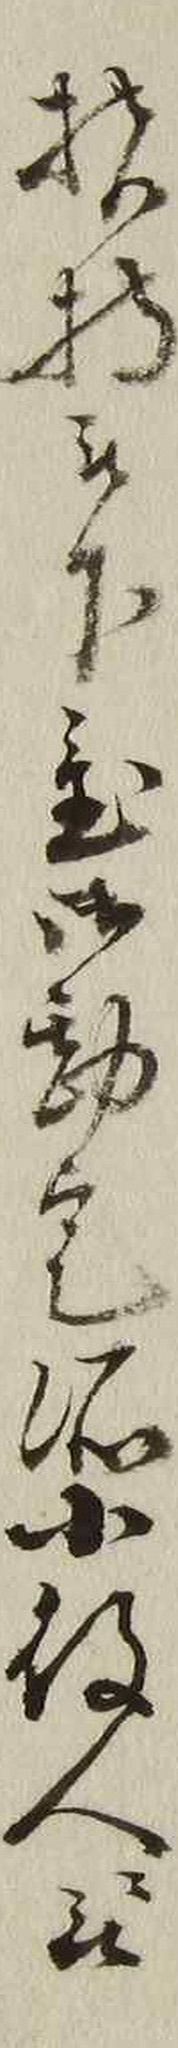扶持被下置御勘定所小役人ニ被
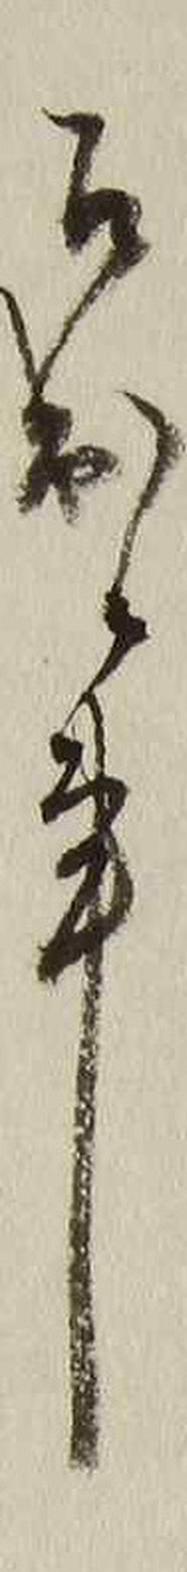召出候事
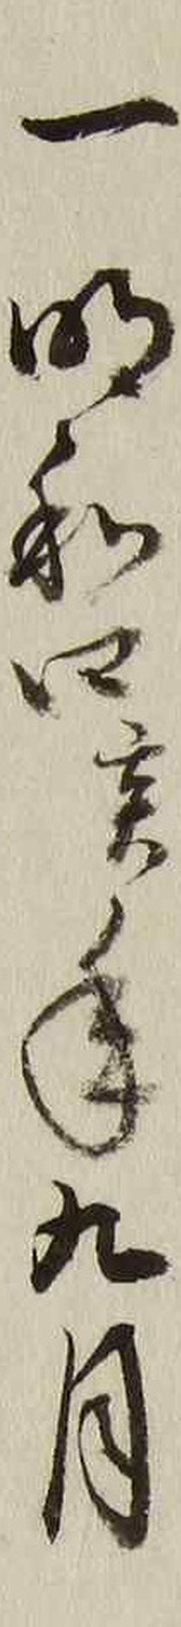一明和四亥年九月
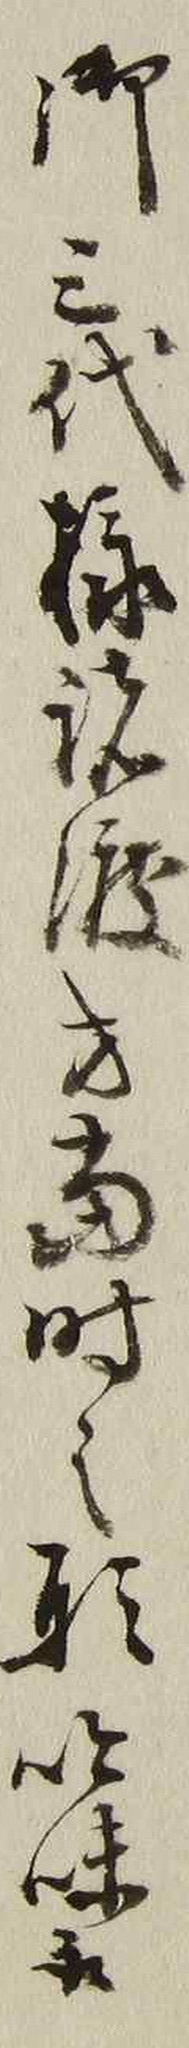御三代様諸渡方当時之形吟味取
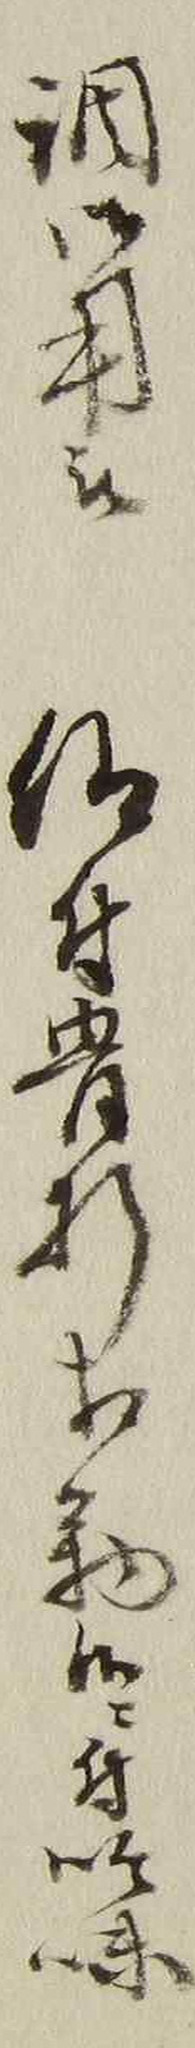調御用被仰付骨折相勤候ニ付吟味
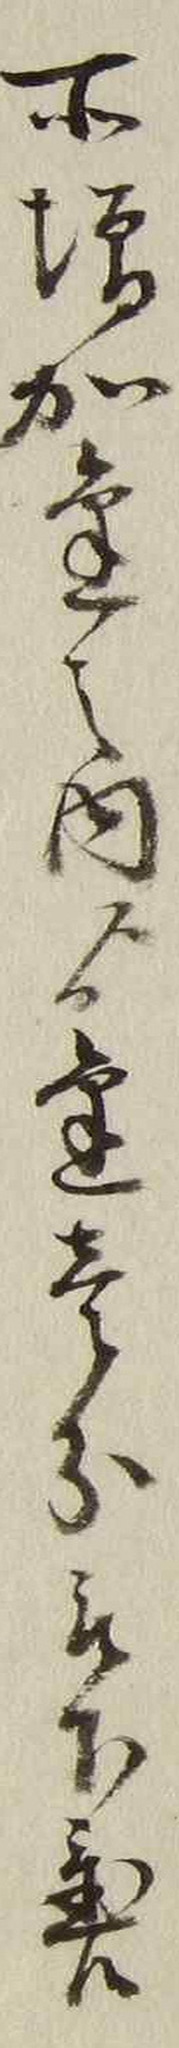所増加金之内ゟ金壱分被下置候

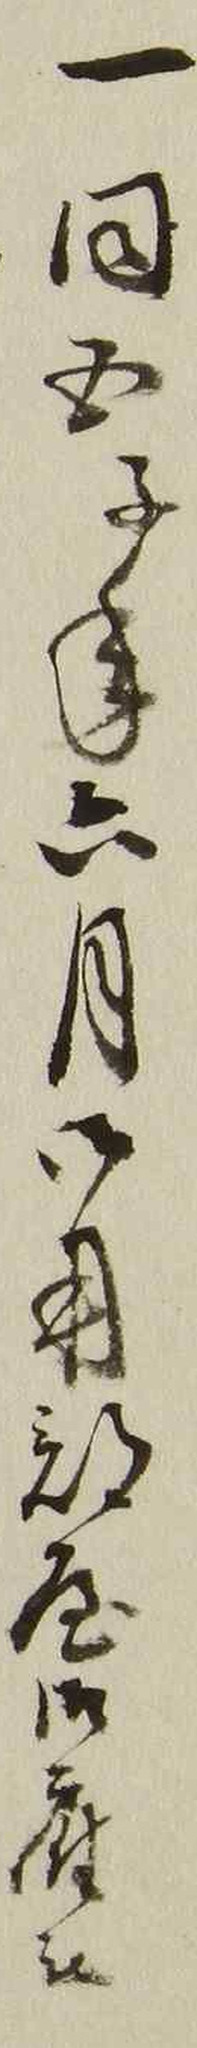一同五子年六月御用部屋御雇被
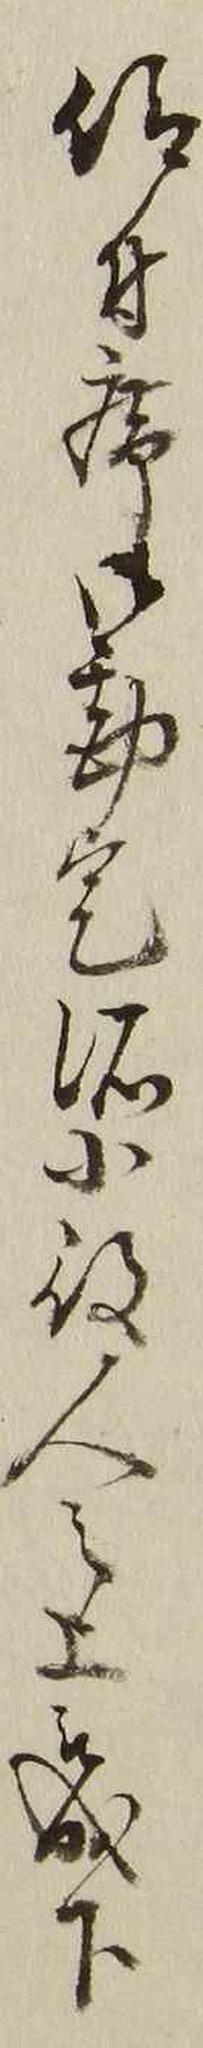仰付席御勘定所小後人之上被成下
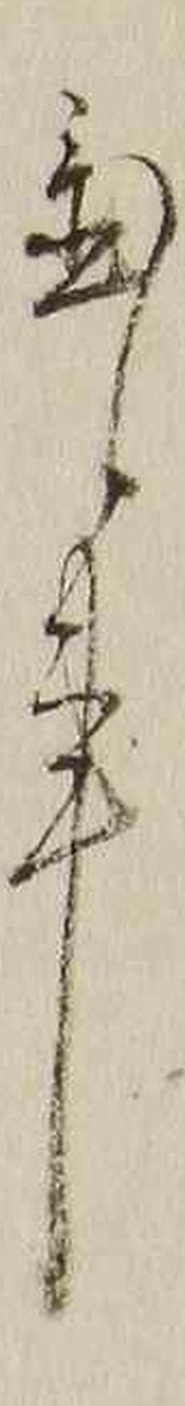置候事
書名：諸士系譜　巻之36　は之部4
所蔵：会津若松市立会津図書館
